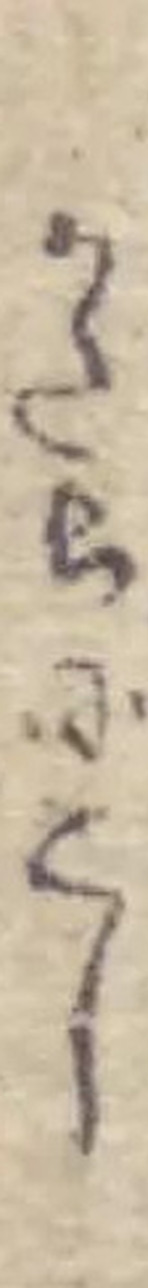かたちにこし
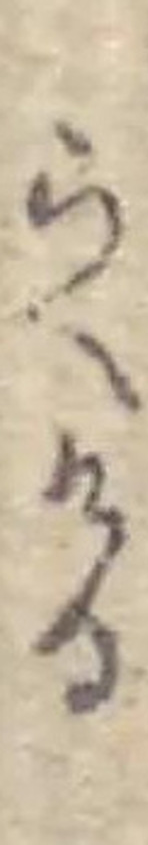らへける
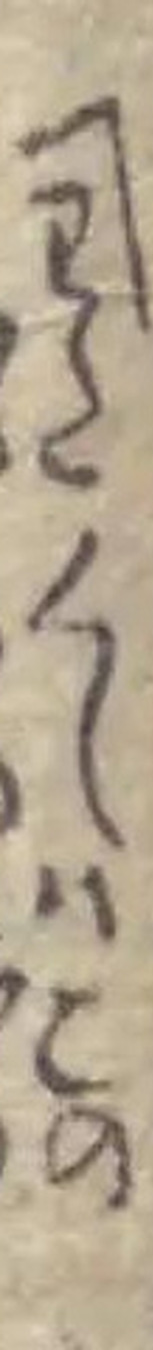〽わたくしはこの
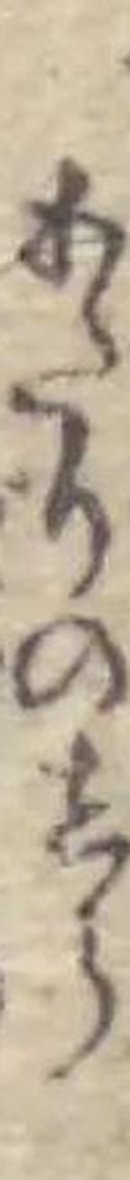あたりのしら
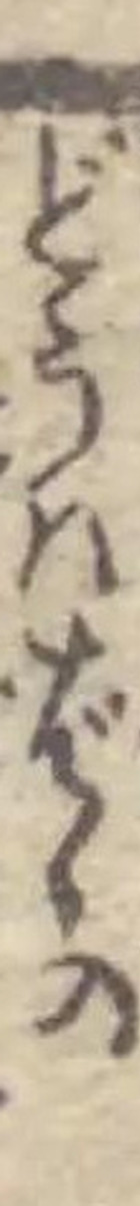どうはばゝの
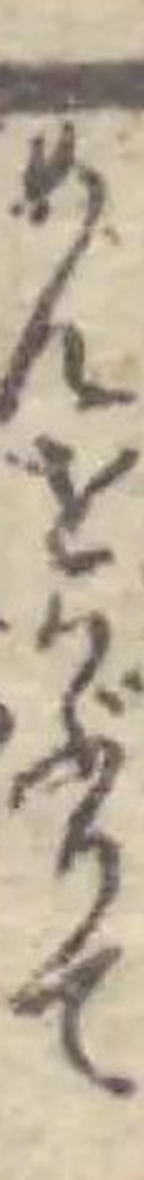めんをかぶりて
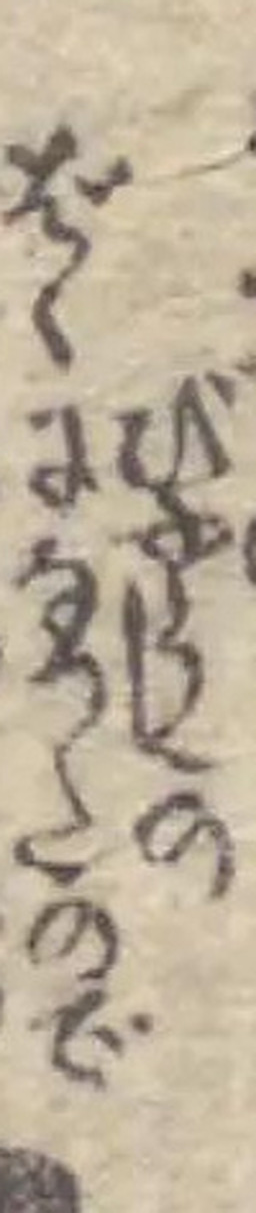ばゝになつたので
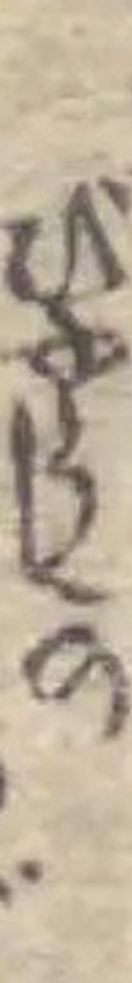びやうしの
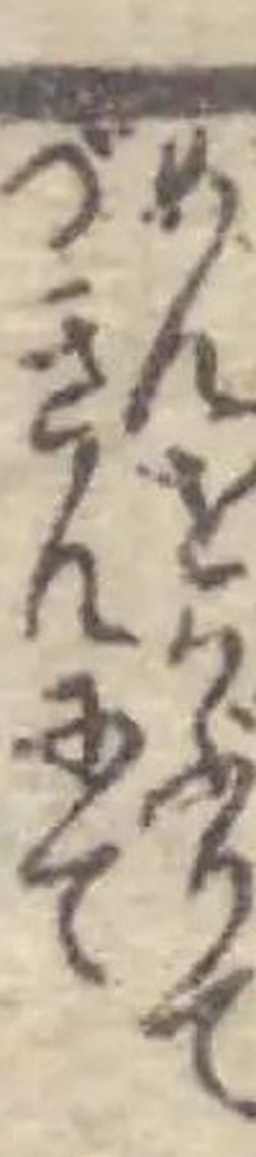づきんにて
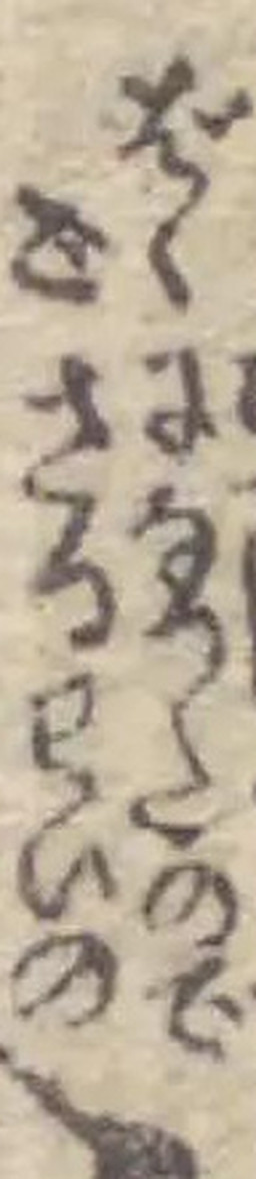ごさるわいの
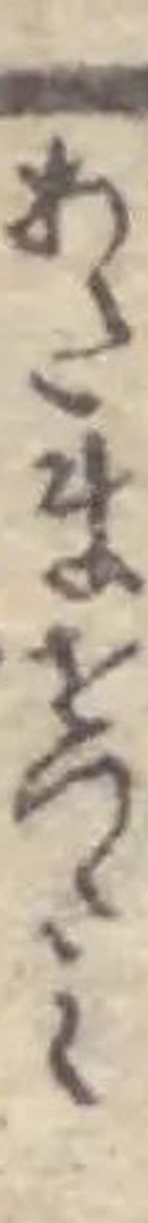あたまをつゝみ
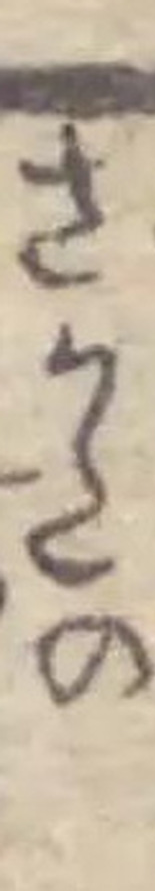さかたの
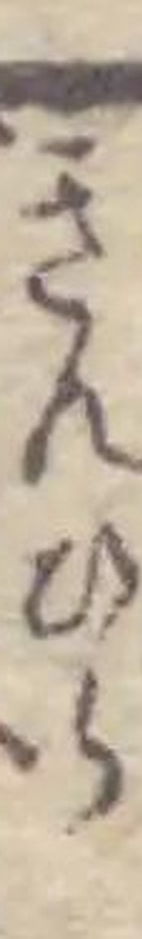きんひら
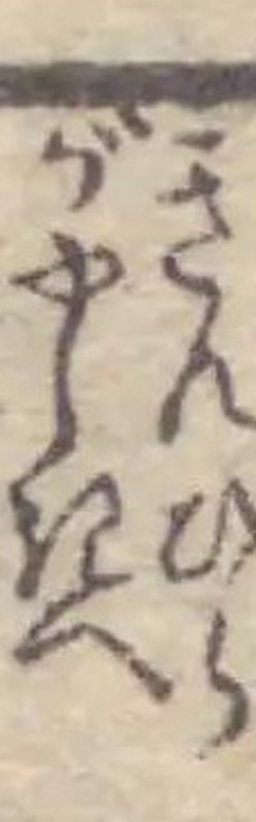がやしきへ
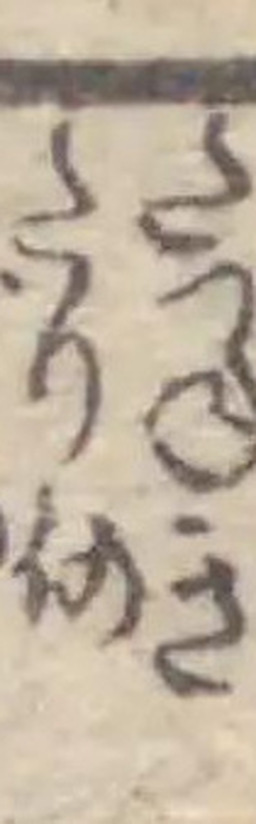たり何
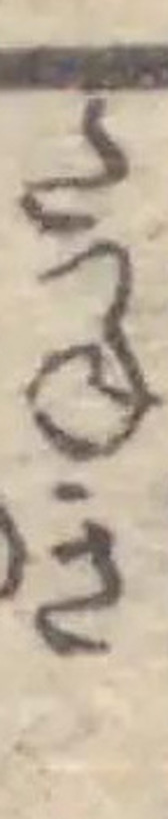たつねき
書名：化物尽 4巻
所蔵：国立国会図書館 National Diet Library, JAPAN
